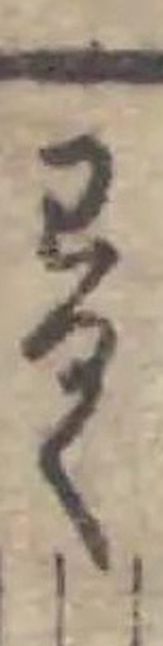わるく
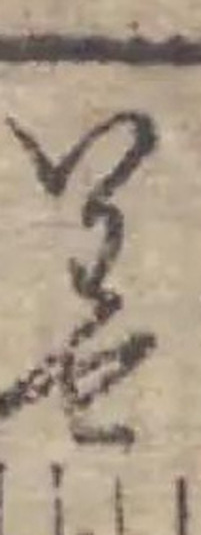いわせ
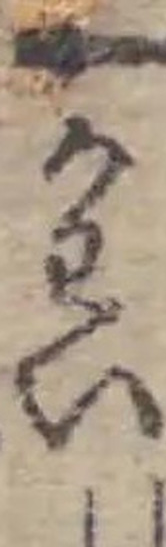かわい
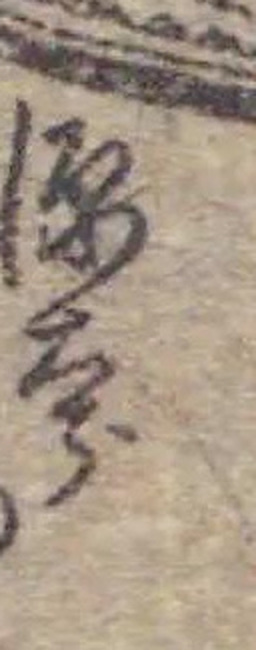源太郎
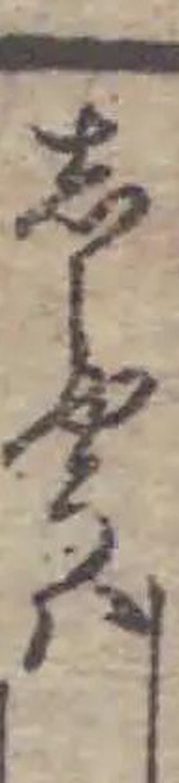ししやうは
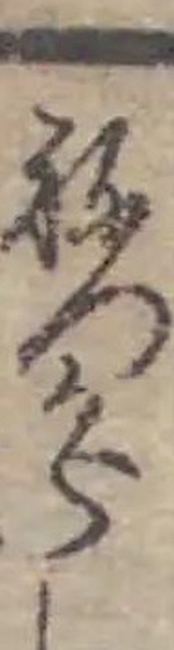ねつから
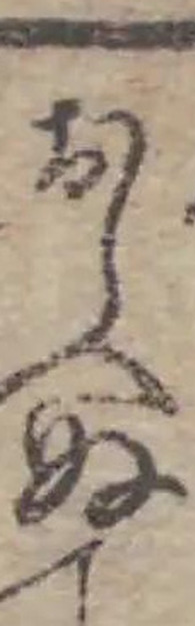おしへぬ
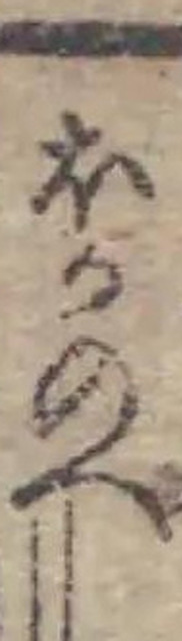ほかのへ
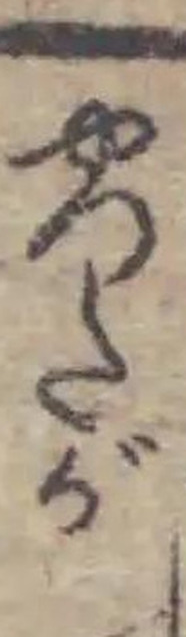やつたが
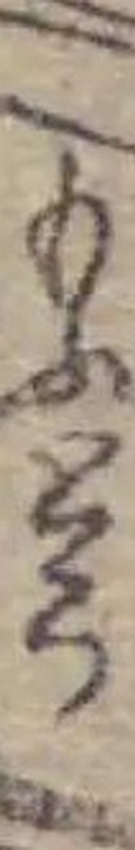もふとう
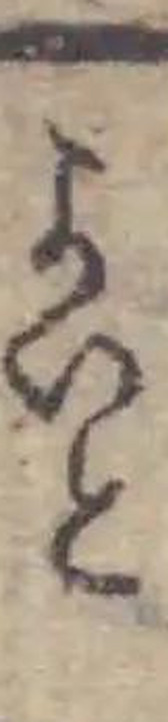よいと
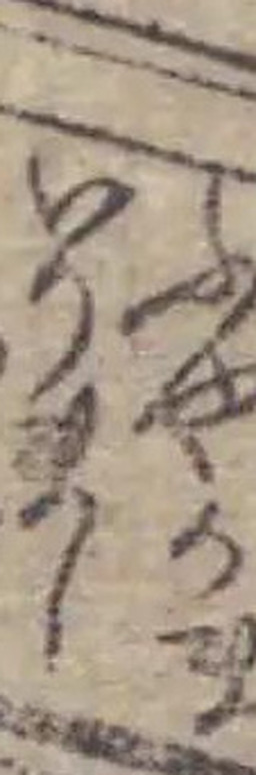いりまし
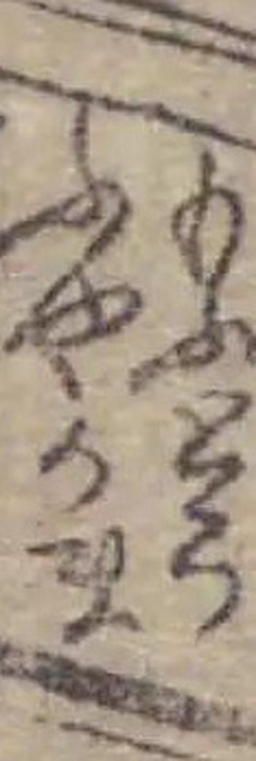ふやかま
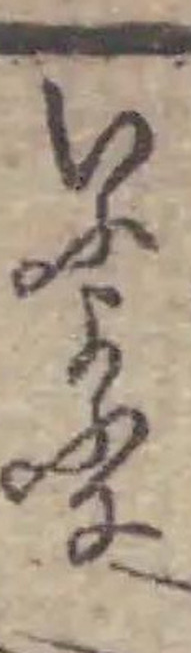いふよふに
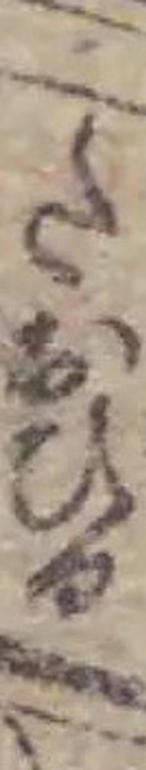たおひる
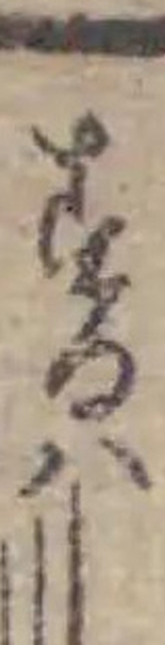するは
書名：津以曽無弟の甚六 3巻
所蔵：国立国会図書館 National Diet Library, JAPAN
